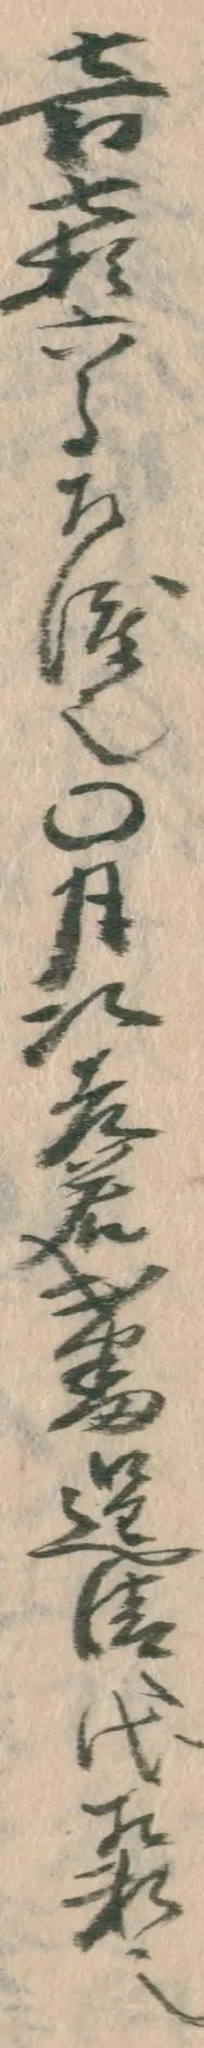七百七拾六文相渡也○月次老若出番逞清ヘ代相頼也
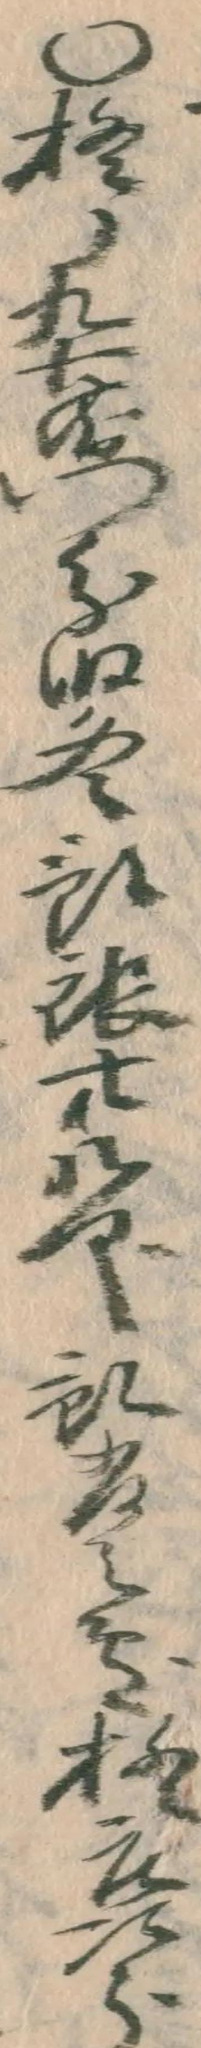○柊ノ九右衛門分旧冬預銀廿八匁預者之處柊庄次郎
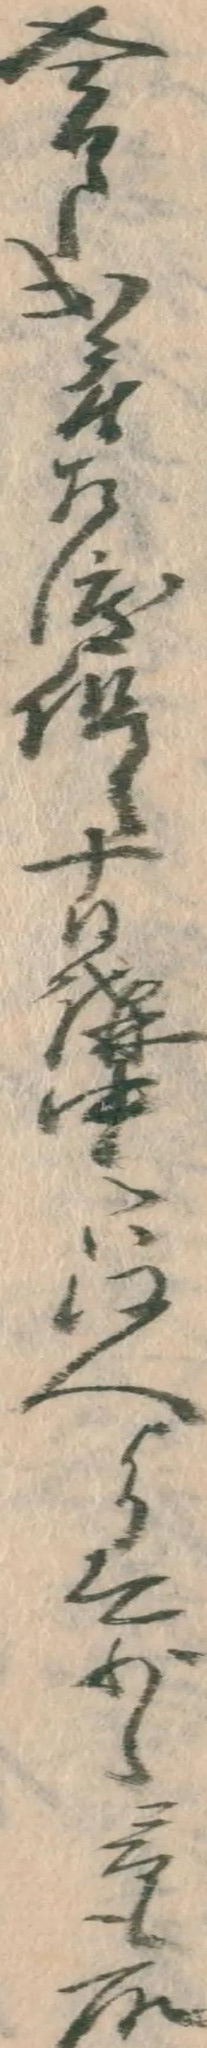今日之出ニ付相渡但し十日講中へハ同人より今少々二而も取
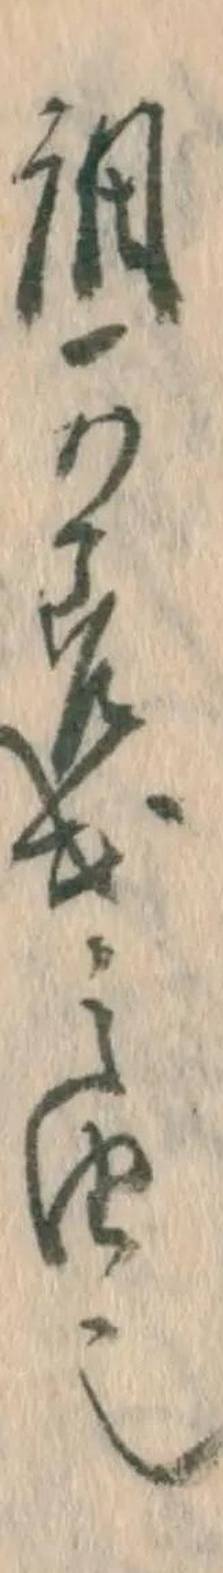調可差出之由也
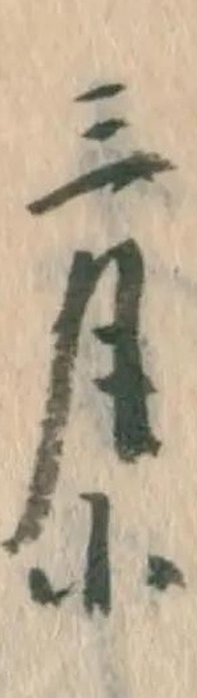三月小
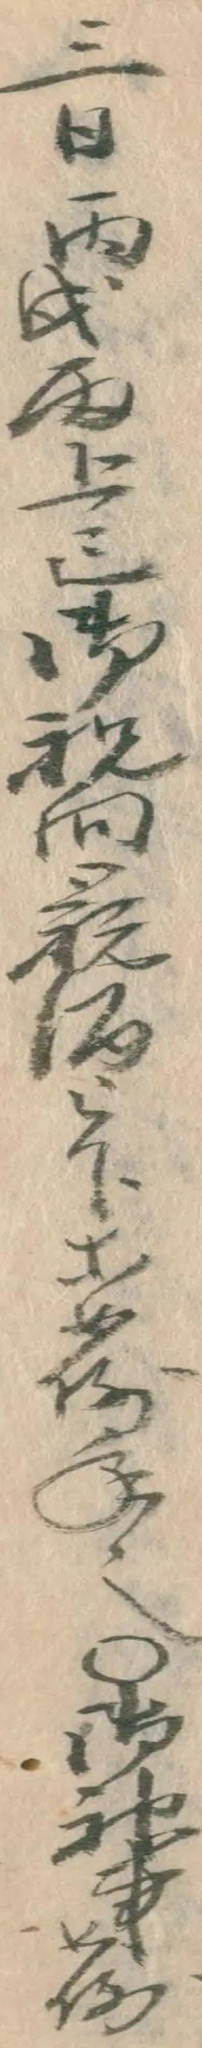三日丙戌雨上三御祝向御祝酒被下等如例年也○御神事如例
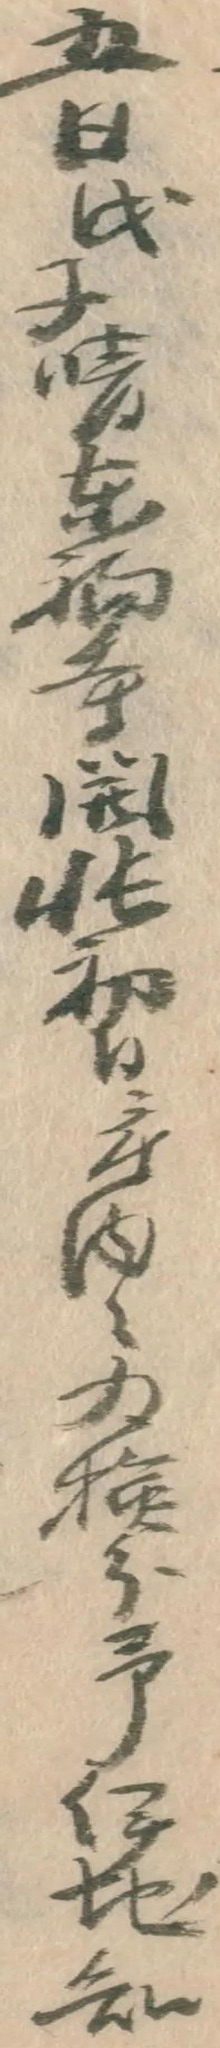五日戊子晴東福寺開帳初日ニ付内々為検分予伊地知
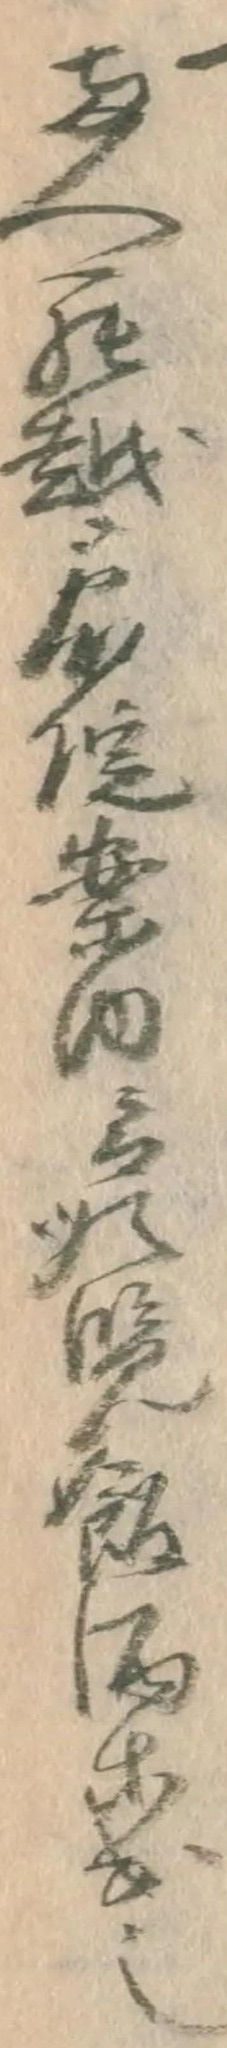両人罷越御届院案内ニ而順覧飯酒等出也

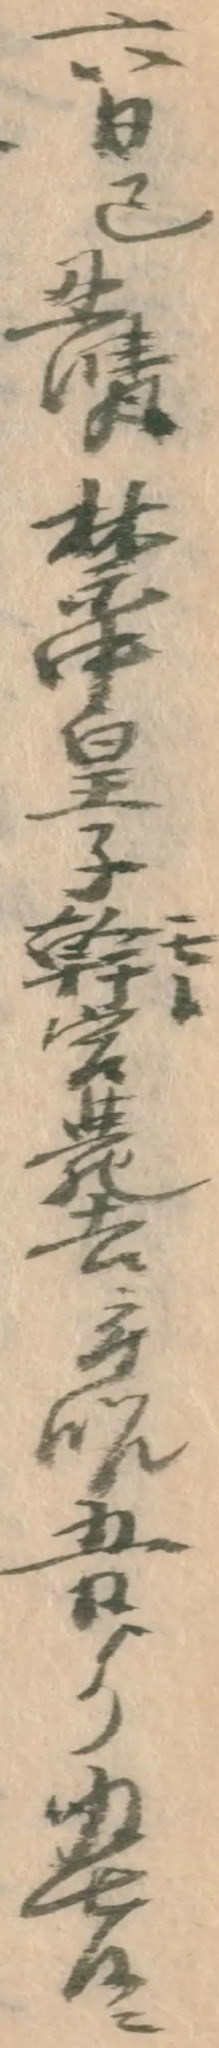六日己丑晴禁中皇子幹宮薨去ニ付昨五日より明七日ニ
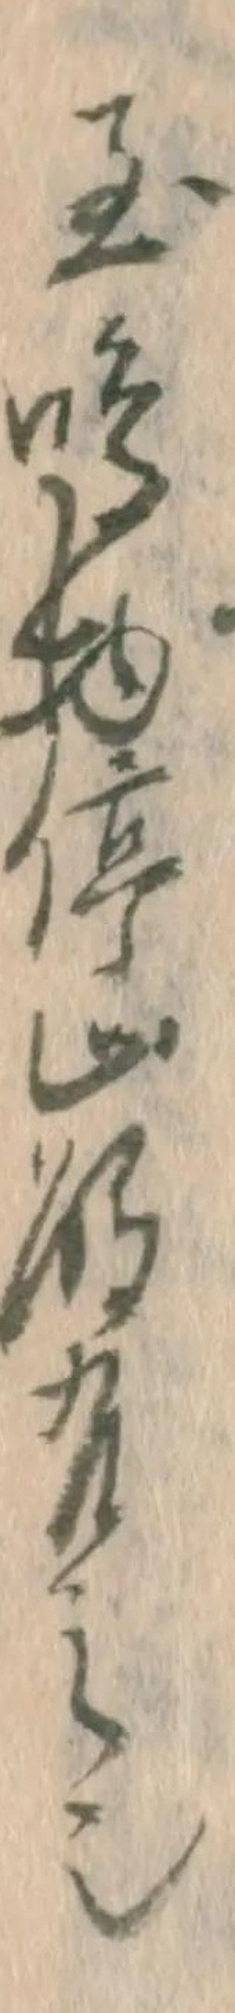至鳴物停止觸有之也
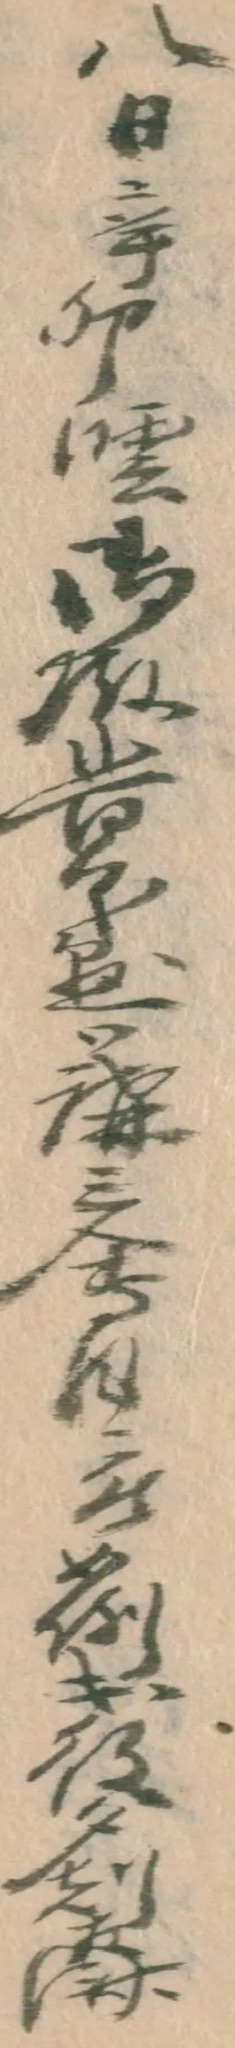八日辛卯曇御殿弐百匁鬮御講三會目ニ付如例出役夕刻相済
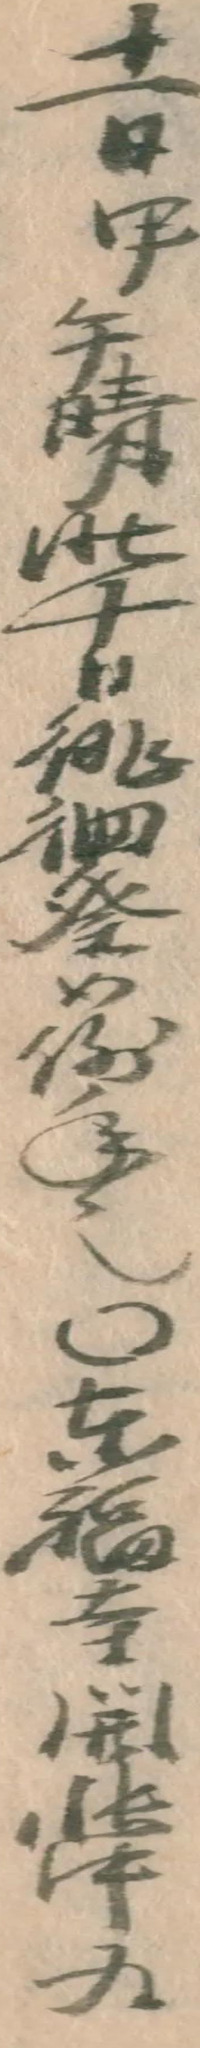十一日甲午晴昨十日徘徊祭如例年也○東福寺開帳中為
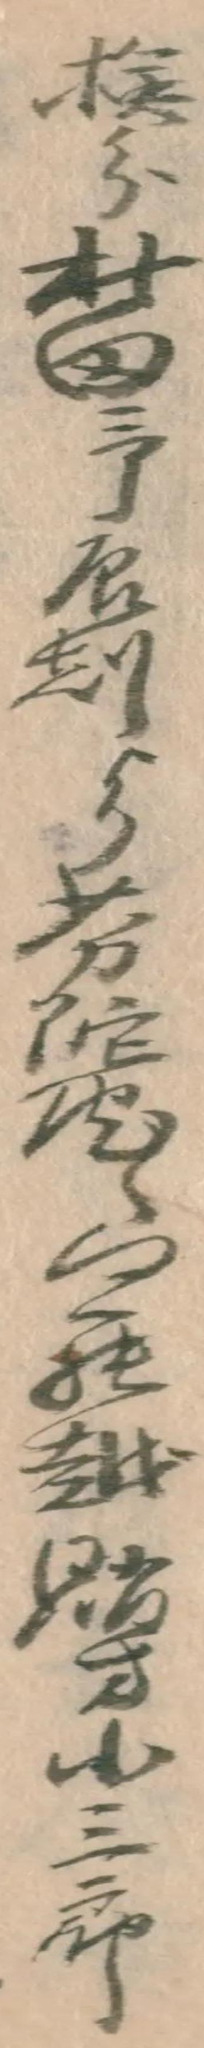検分村田予辰刻より芬陀院へ向罷越賄方小三郎
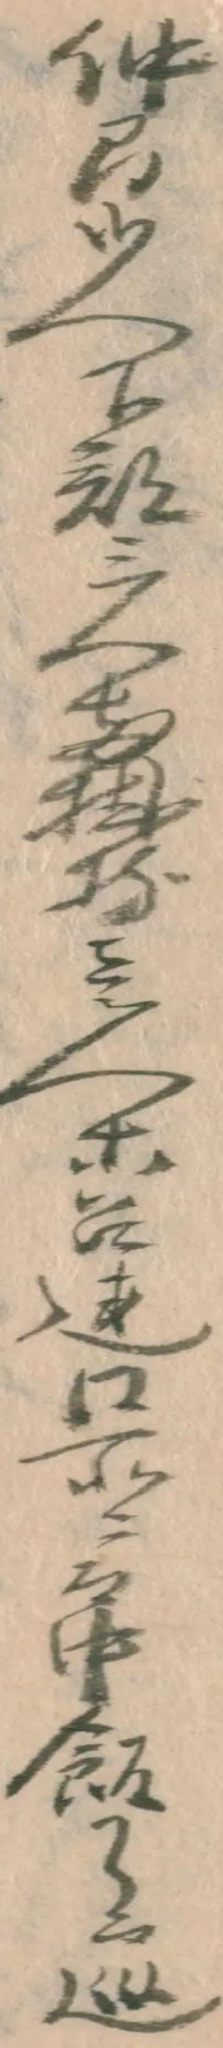仲間弐人下部三人両掛持壱人等召連同所に而中飯了而巡
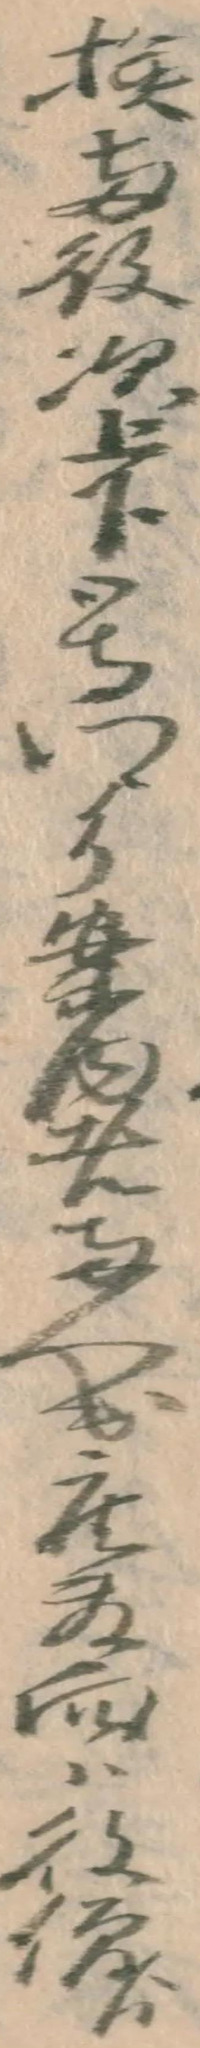検両役次上下御寺門より案内者両人出座敷向ハ役僧ゟ
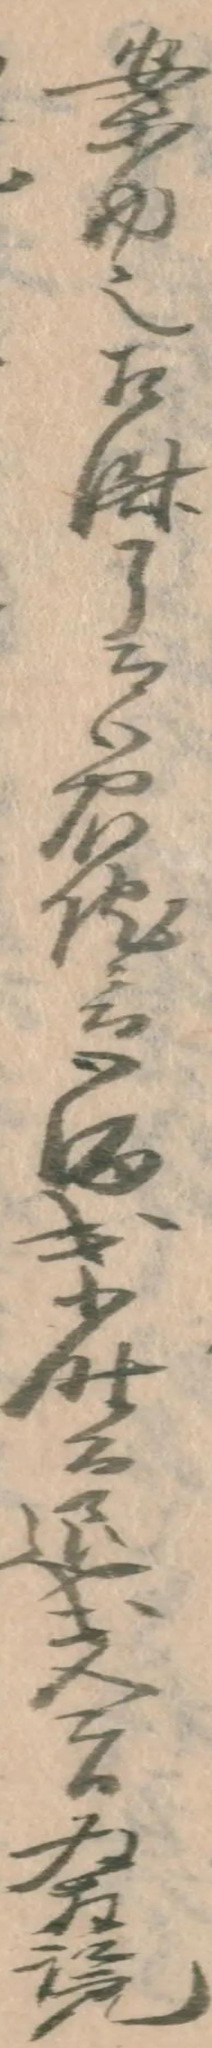案内之相済了而御宿院ニ而御酒出小時而退出入候為拝礼
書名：賀茂社記録. 第67冊
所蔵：国立国会図書館 National Diet Library, JAPAN
